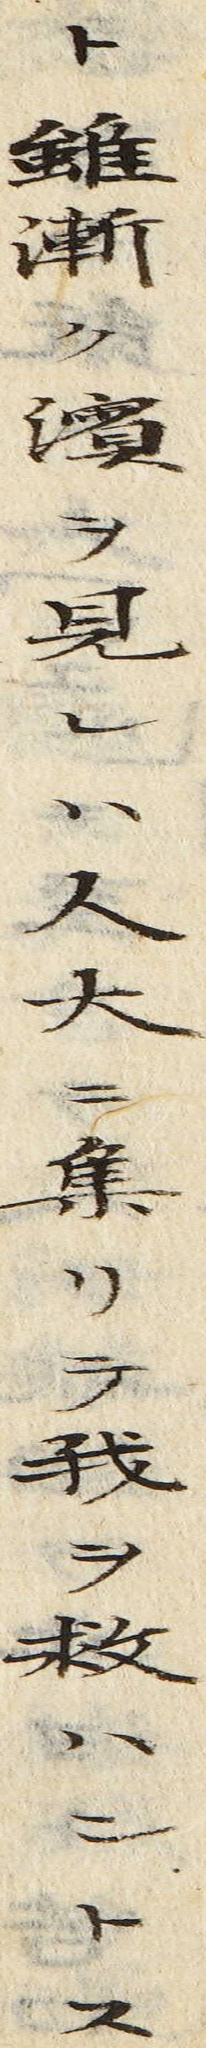ト雖漸ク浜ヲ見レハ人大ニ集リテ我ヲ救ハントス
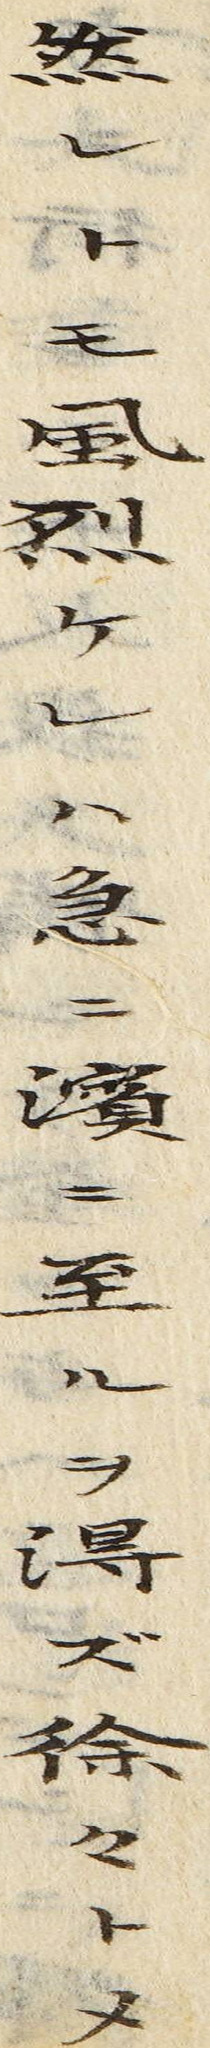然レトモ風烈ケレハ急ニ浜ニ至ルヲ得ズ徐々トシテ
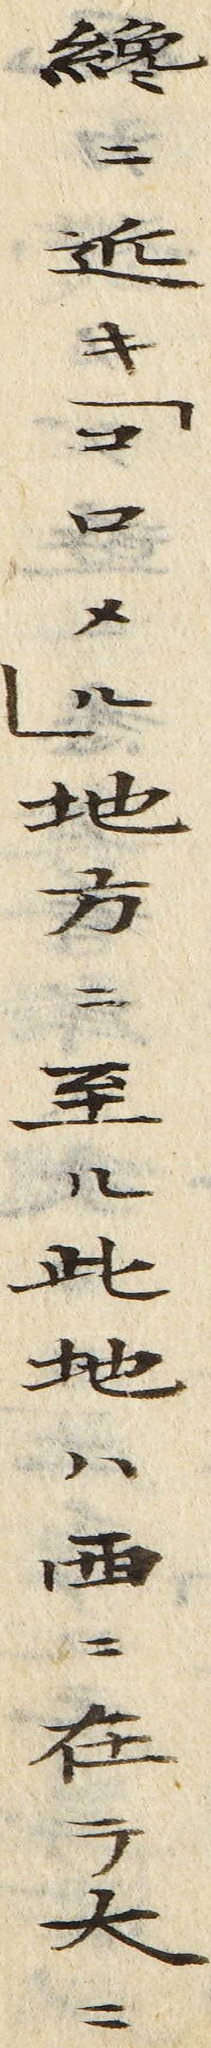纔ニ近キ「コロメル」地方ニ至ル此地ハ西ニ在テ大ニ

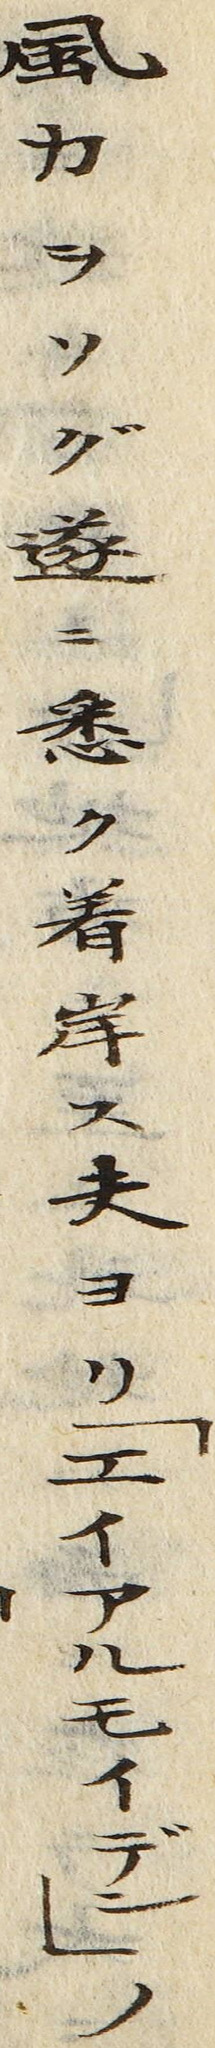風力ヲソグ遂ニ悉ク着岸ス夫ヨリ「エイアルモイデン」ノ
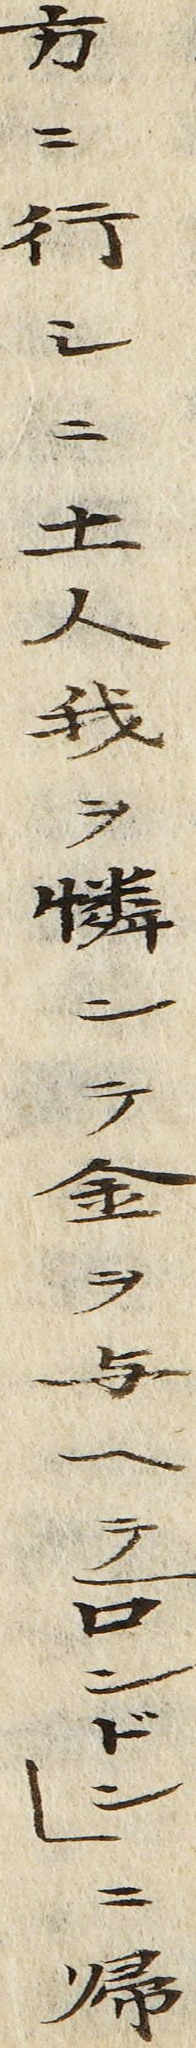方ニ行シニ土人我ヲ憐ンテ金ヲ与ヘテ「ロンドン」ニ帰
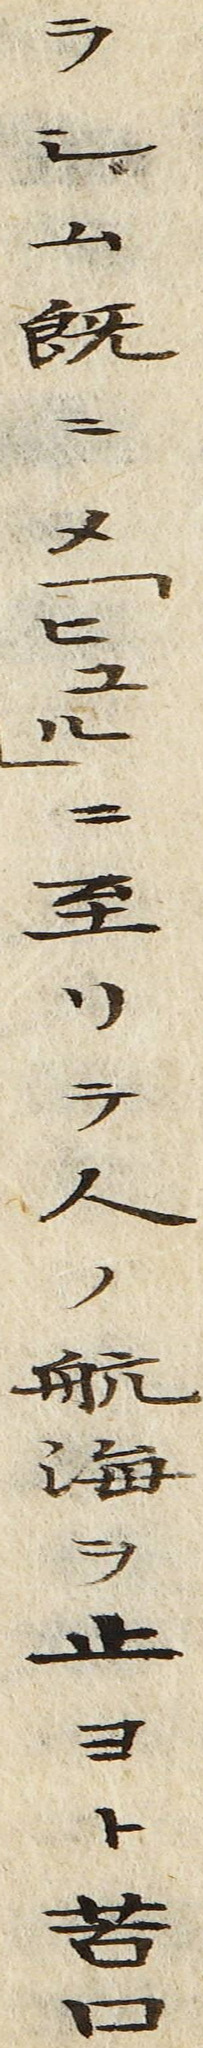ラシム既ニシテ「ヒユル」ニ至リテ人ノ航海ヲ止ヨト苦口
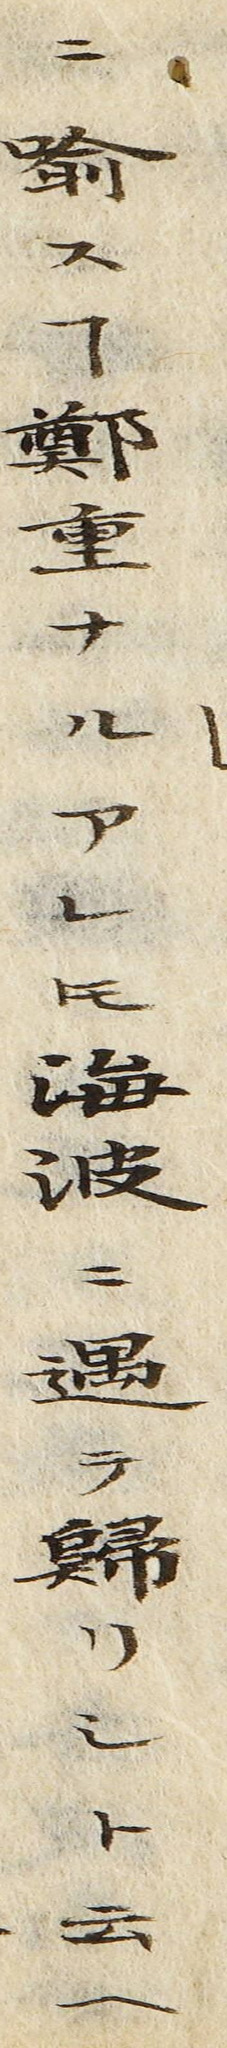ニ諭スコト鄭重ナルアレトモ海波ニ遇テ帰リシト云ヘ
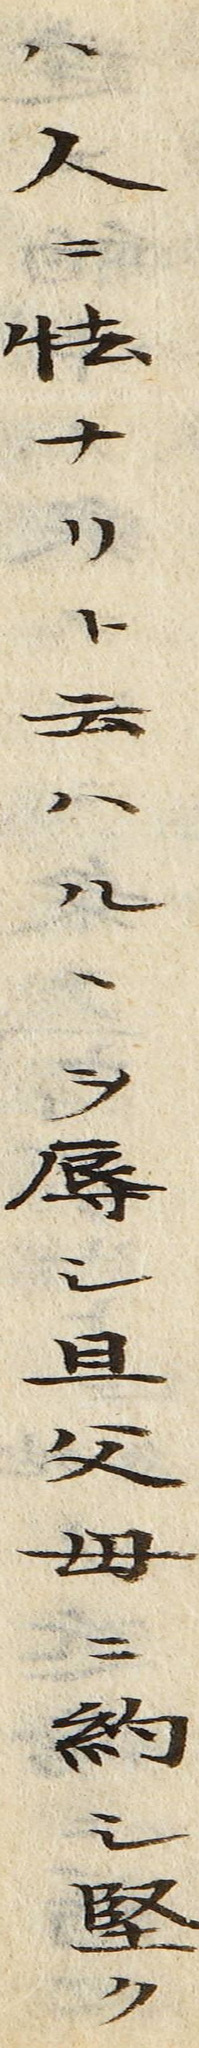ハ人ニ怯ナリト云ハルヽヲ辱シ且父母ニ約シ堅ク
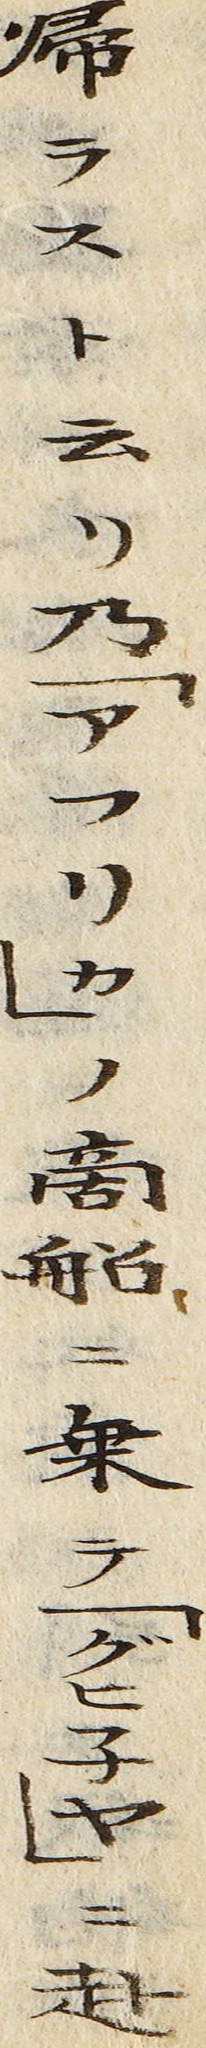帰ラスト云リ乃「アフリカ」ノ商船ニ乗テ「グヒネヤ」ニ赴
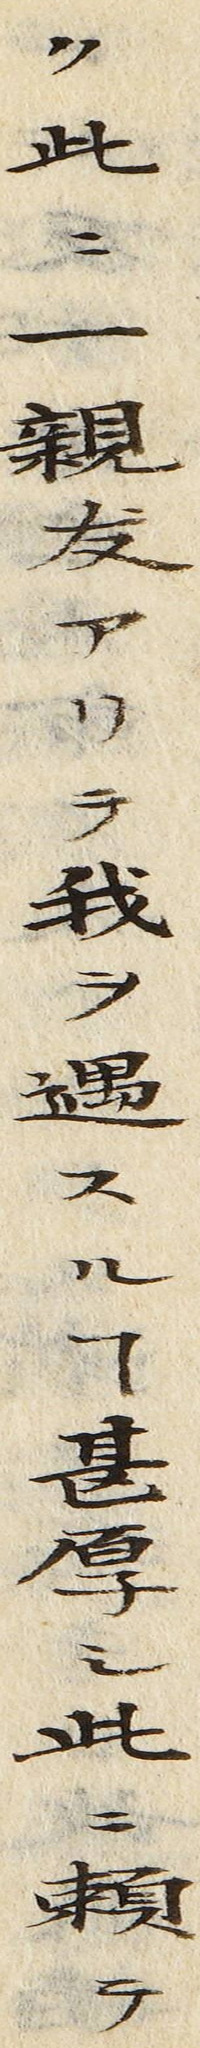ク此ニ一親友アリテ我ヲ遇スルコト甚厚シ此ニ頼テ
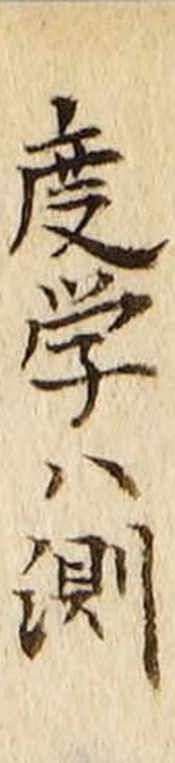度学ハ測
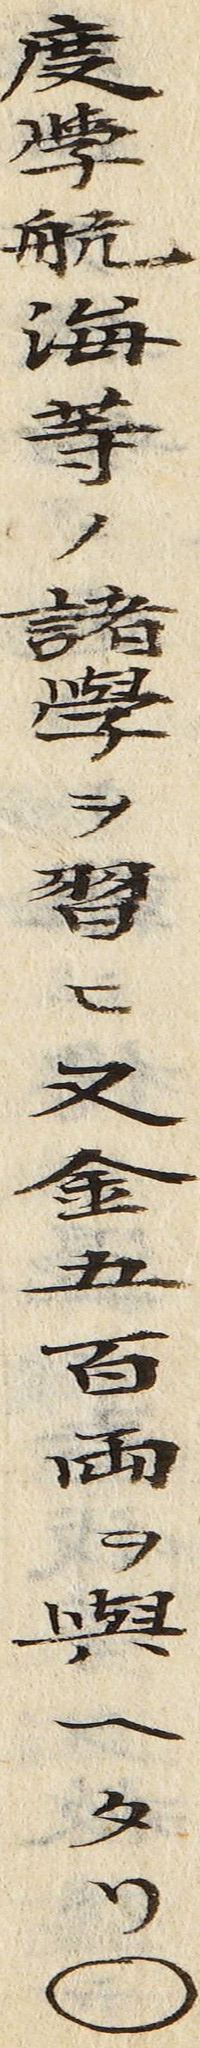度学航海等ノ諸学ヲ習ヒ又金五百両ヲ与ヘタリ○
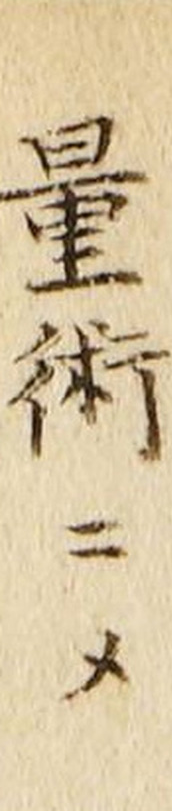量術ニシテ
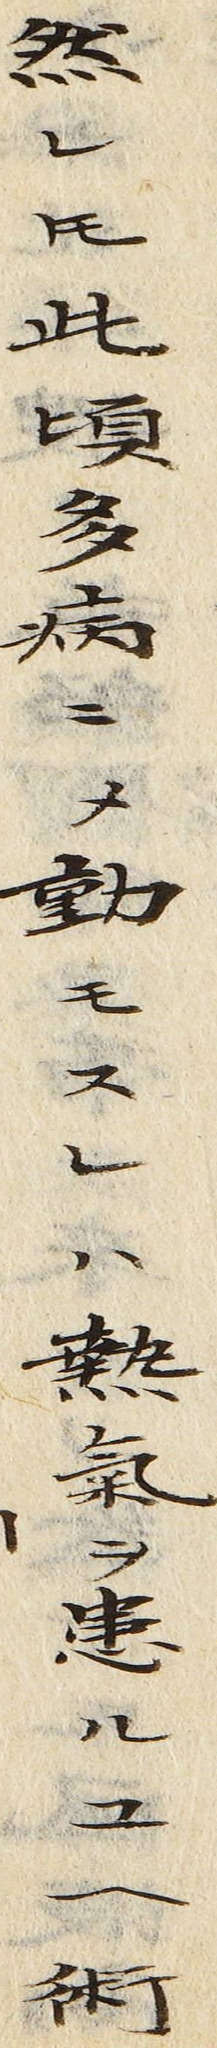然レトモ此頃多病ニシテ動モスレハ熱気ヲ患ルユヘ術
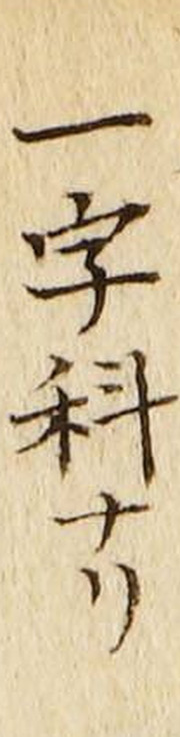一字科ナリ
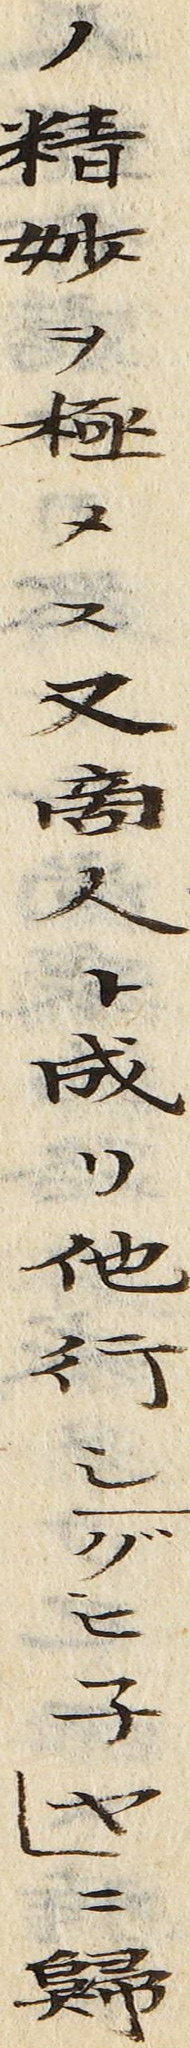ノ精妙ヲ極メス又商人ト成リ他行シ「グヒネヤ」ニ帰
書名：漂流紀事
